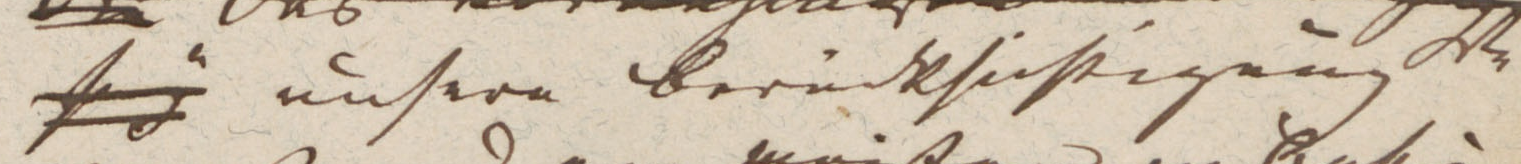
sey unsere Berücksichtigung
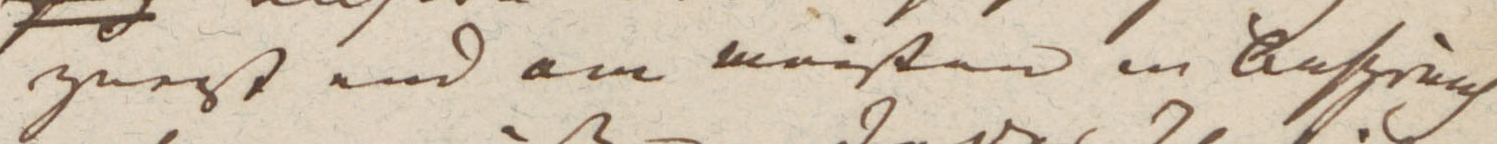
zuerst und am meisten in Anspruch
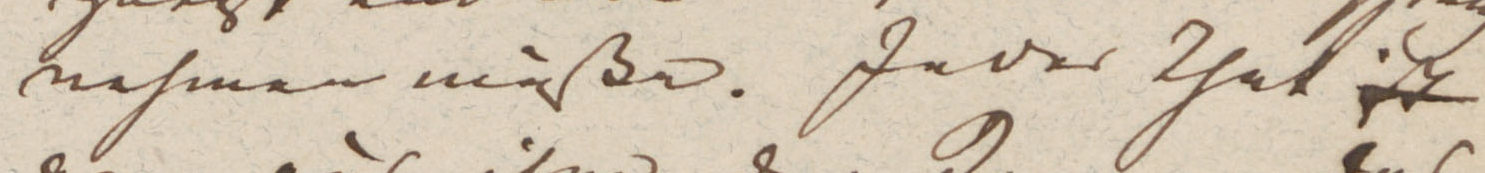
nehmen müsse. In der That ist
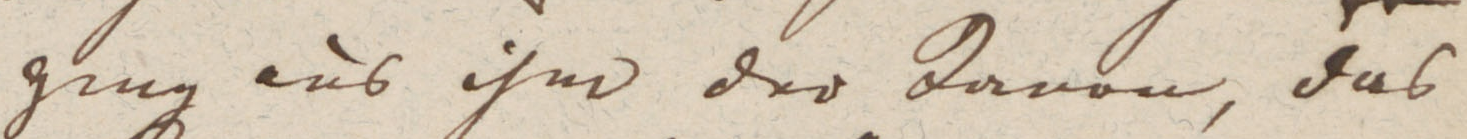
ging aus ihm der Kanon, das
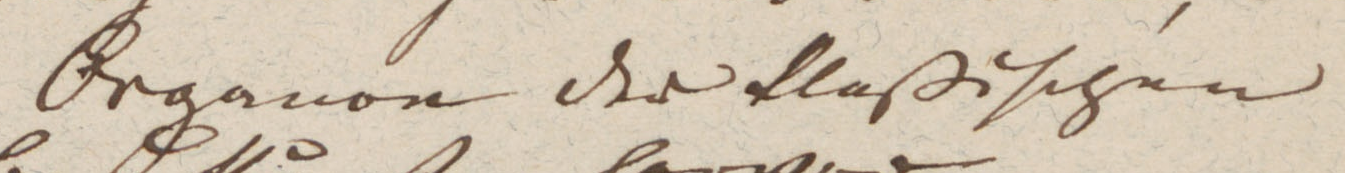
Organon der klassischen
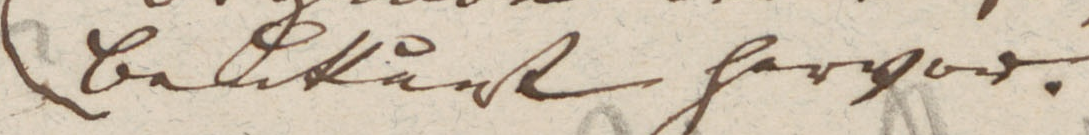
Baukunst hervor.
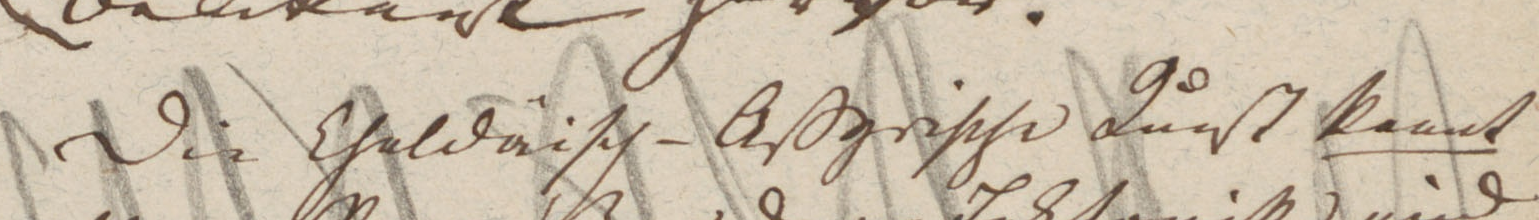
% Die Chaldäisch-Assyrische Kunst kennt
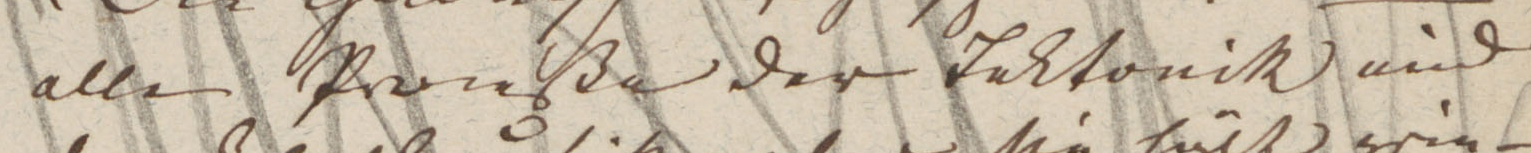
alle Processe der Tektonik und
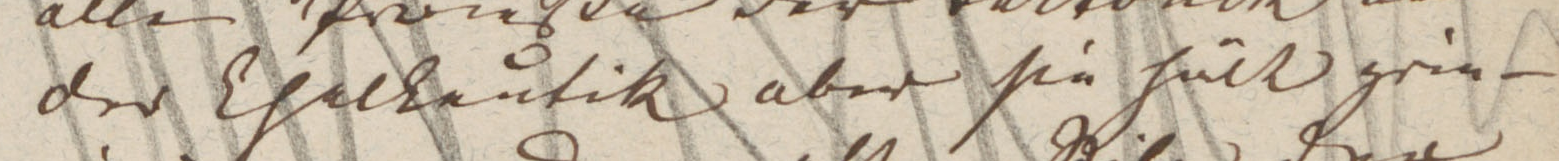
der Chalkeutik aber sie hält prin-
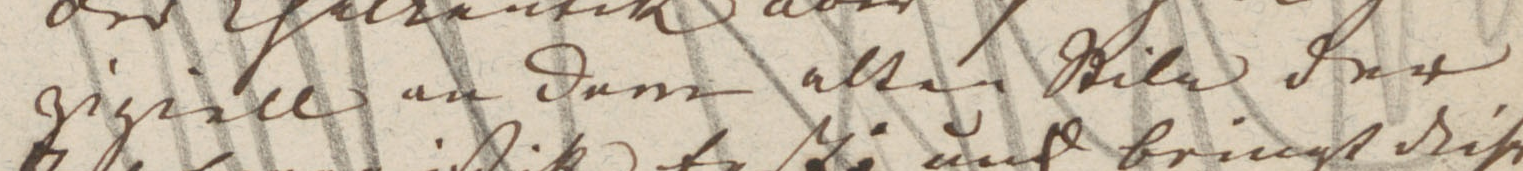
zipiell an dem alten Stile der
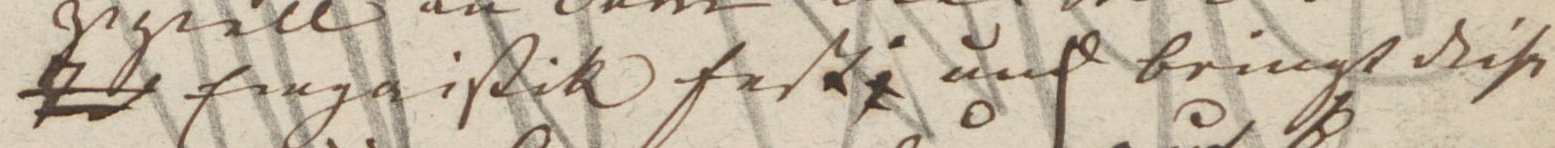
T Empaistik fast; und bringt diese
